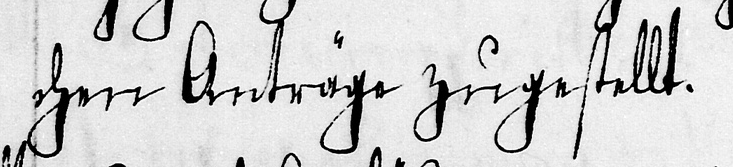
chen Anträge zugestellt.
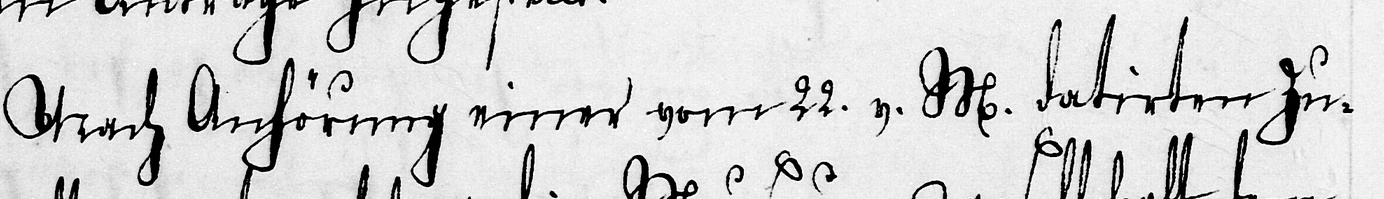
Nach Anhörung einer vom 22. v. M. datirten Zus¬
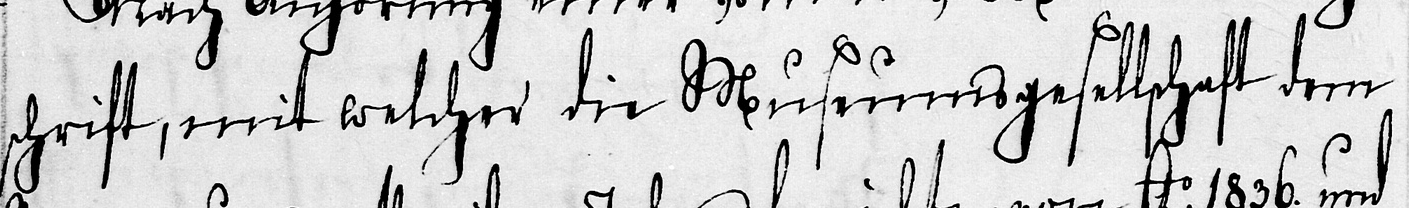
chrift, mit welcher die Museumsgesellschaft dem
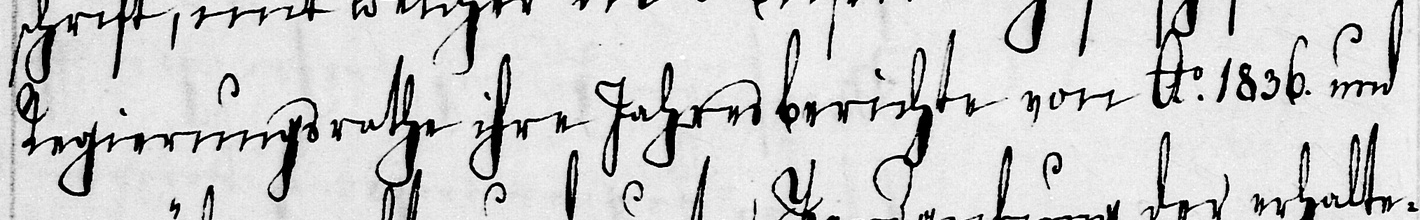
Regierungsrathe ihre Jahresberichte von Ao. 1836. und
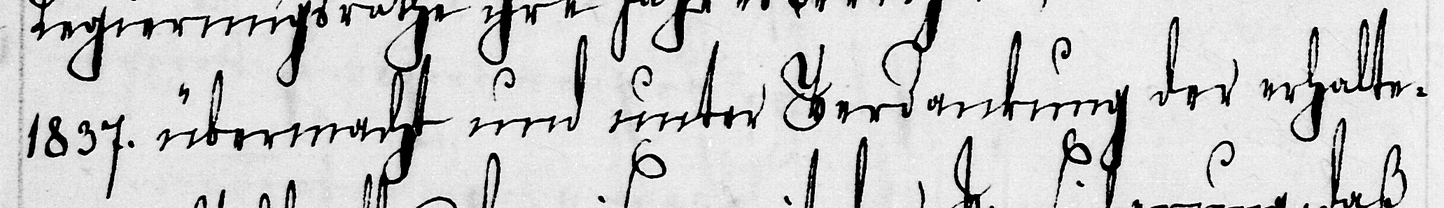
1837. übermacht und unter Verdankung der erhalte¬
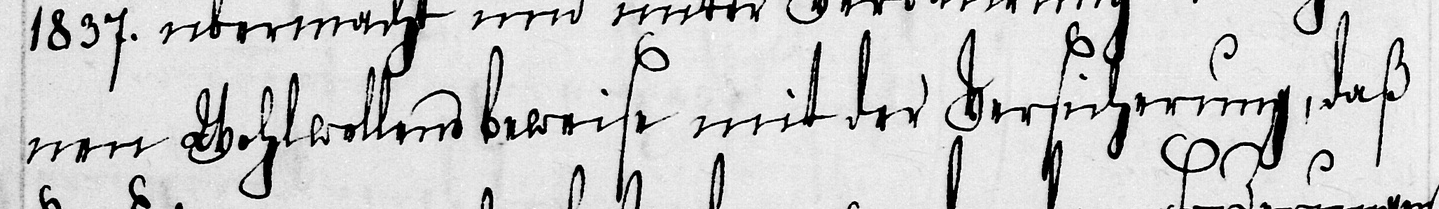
nen Wohlwollensbeweise mit der Versicherung, daß
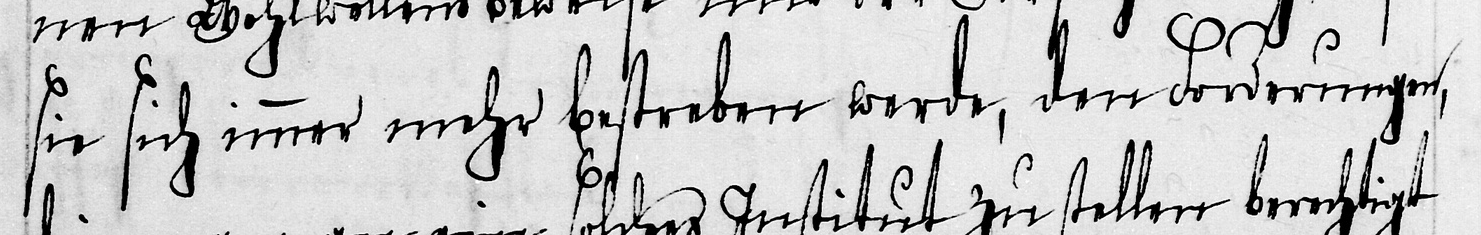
sie sich immer mehr bestreben werde, den Forderungen,
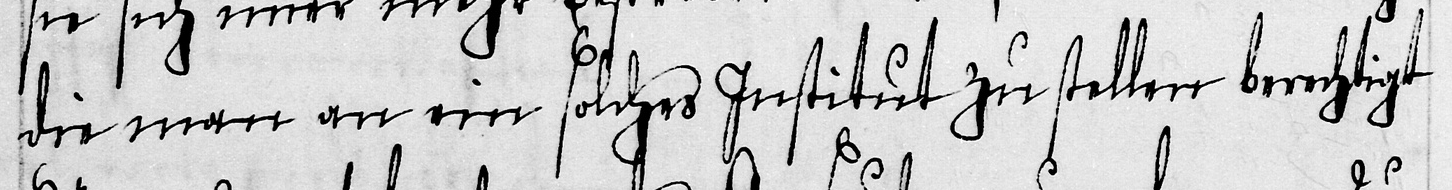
die man an ein solches Institut zu stellen berechtigt
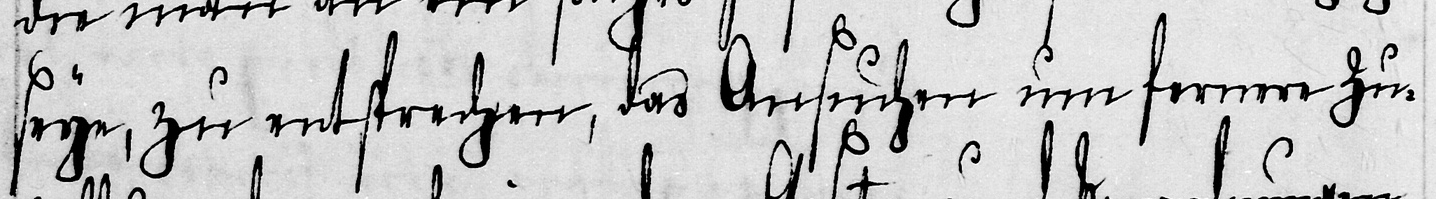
seye, zu entsprechen, das Ansuchen um fernere Zu¬
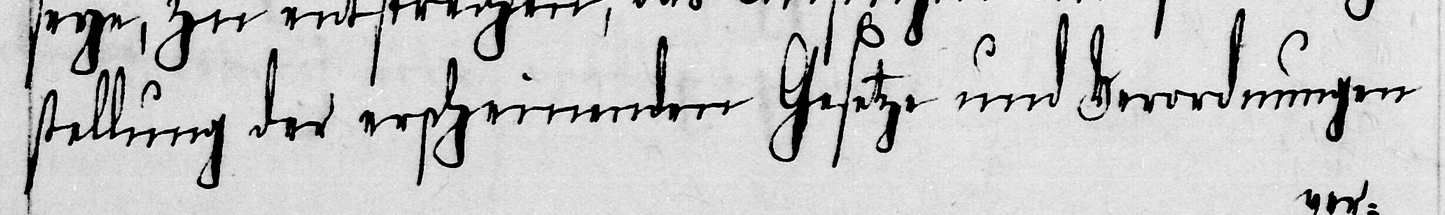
stellung der erscheinenden Gesetze und Verordnungen
